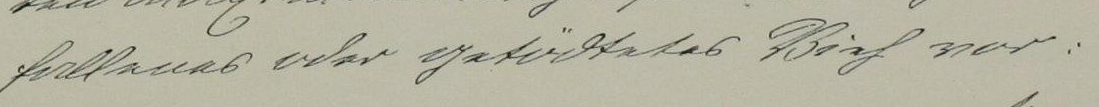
fallenes oder getötetes Vieh vor:
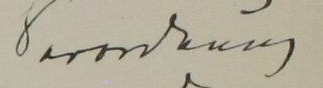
Verordnung
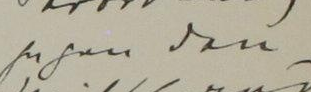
gegen den
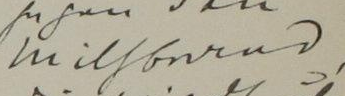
Milzbrand
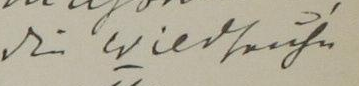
die Wildseuche
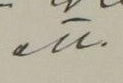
etc.
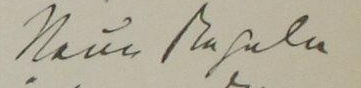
Neue Regeln
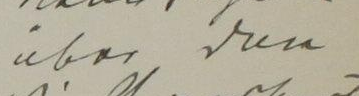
über den
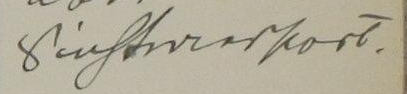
Viehtransport.
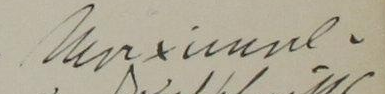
Maximal-
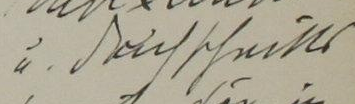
u. Durchschnitts
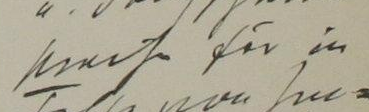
preise für in
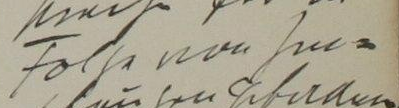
Folge von Im-
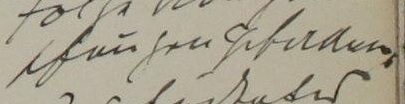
pfungen gefallenes
